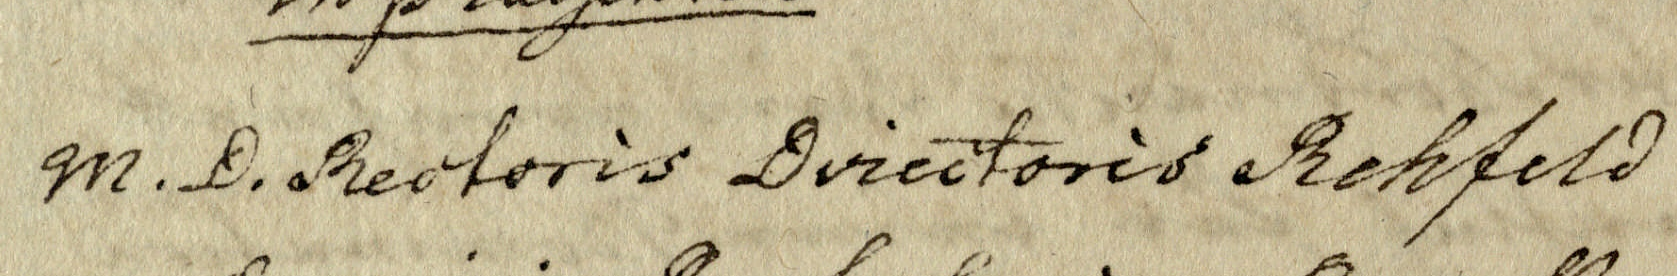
M. D. Rectoris Directoris Rehfeld
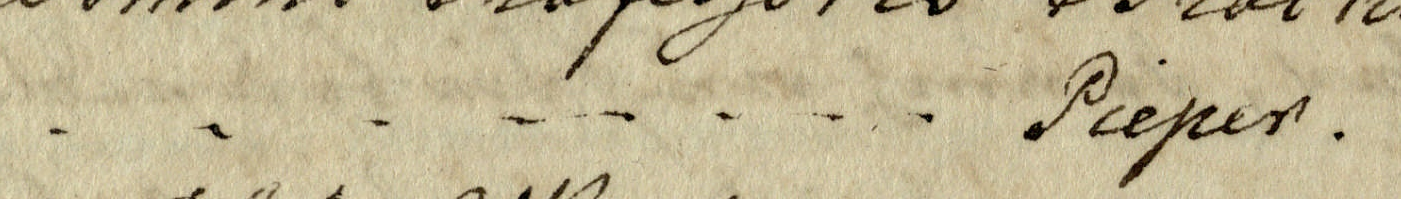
Pieper.
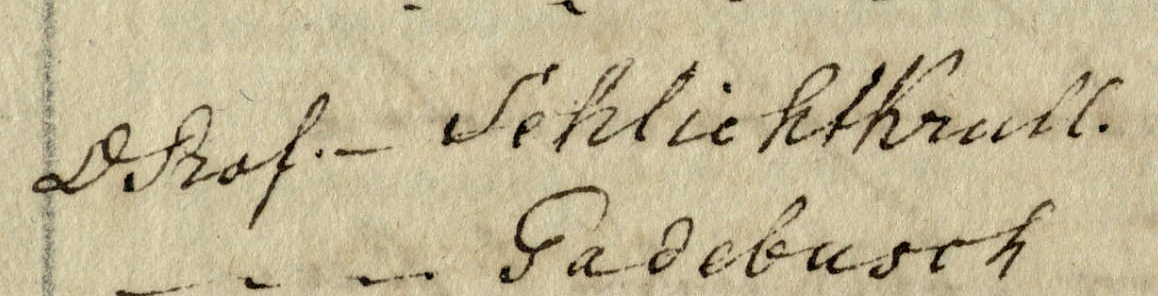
D Prof Schlichtkrull.
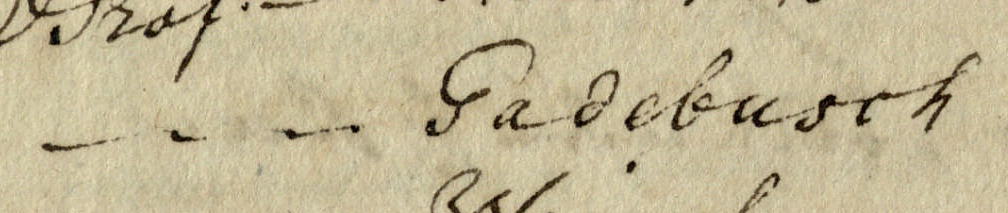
Gadebusch
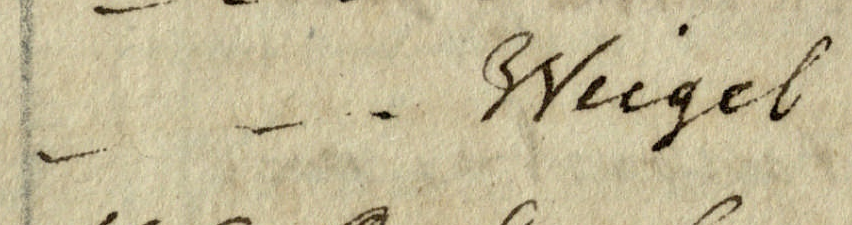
Weigel
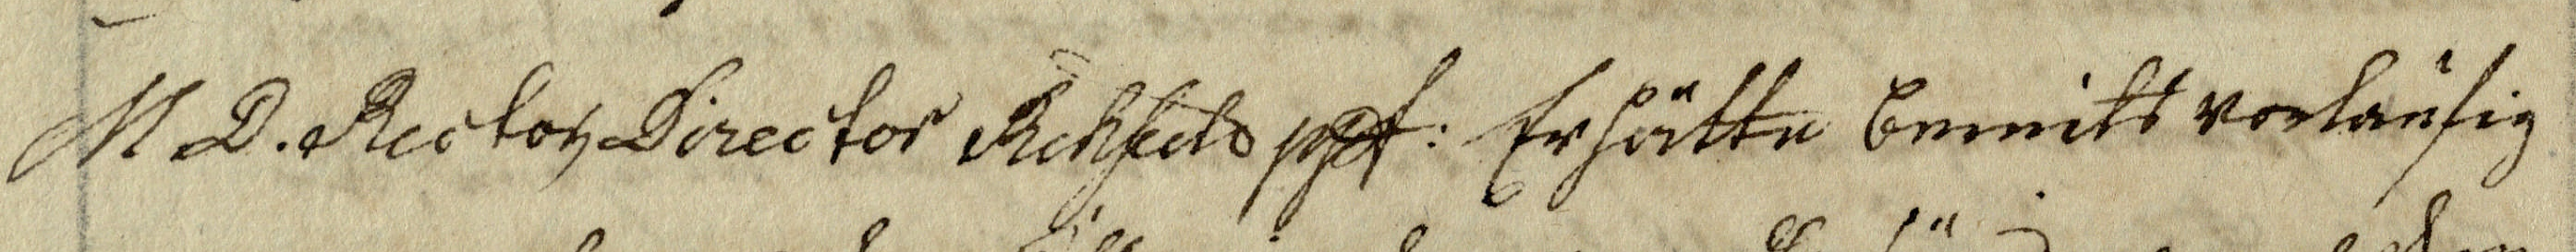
M. D. Rector, Director Rehfeld ppt. Er hätte bereits vorläufig
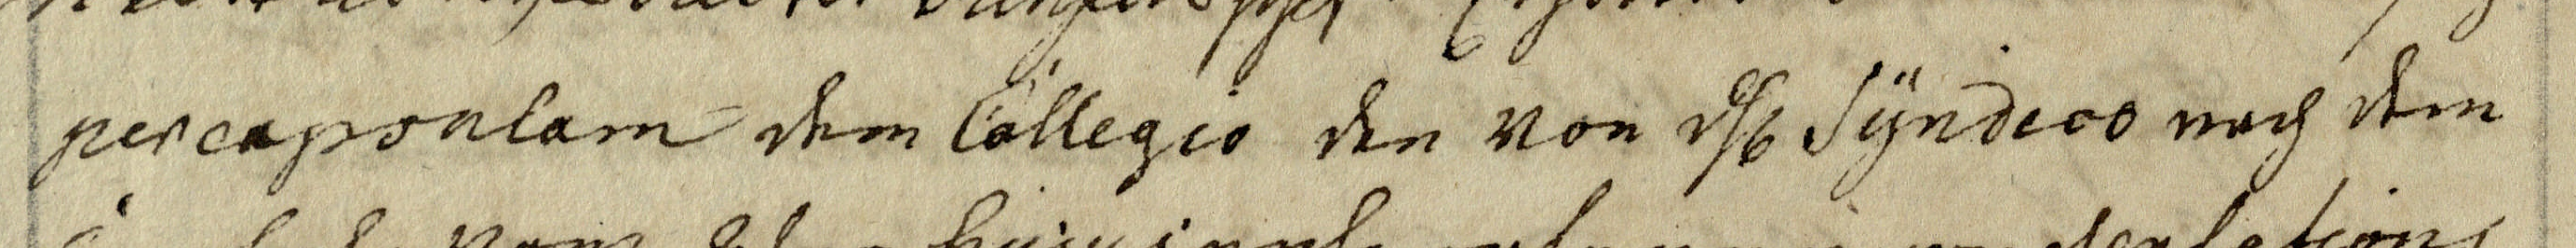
per Capsulam dem Collegio den von dh Sÿndico nach dem
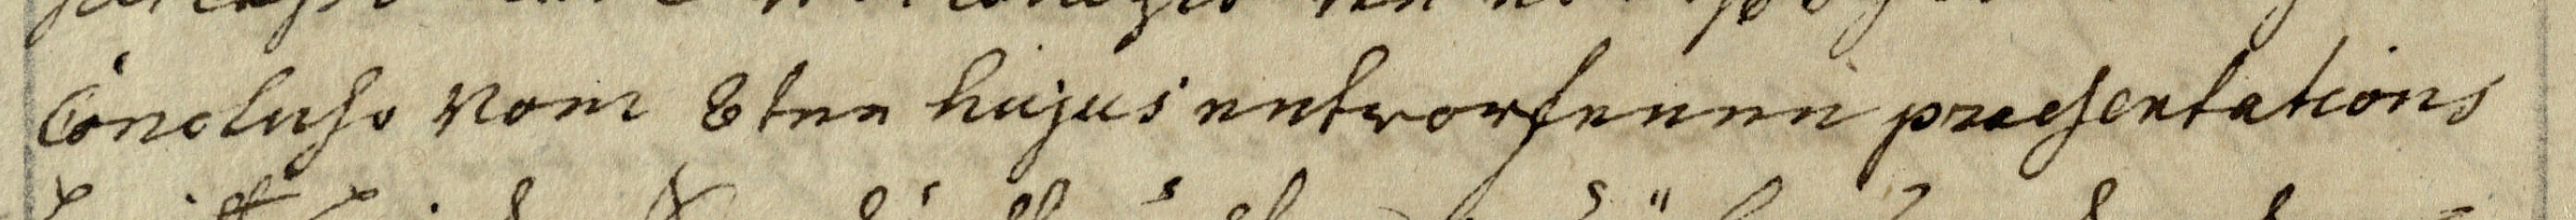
Concluso vom 8 ten hujus entworfenen praesentations
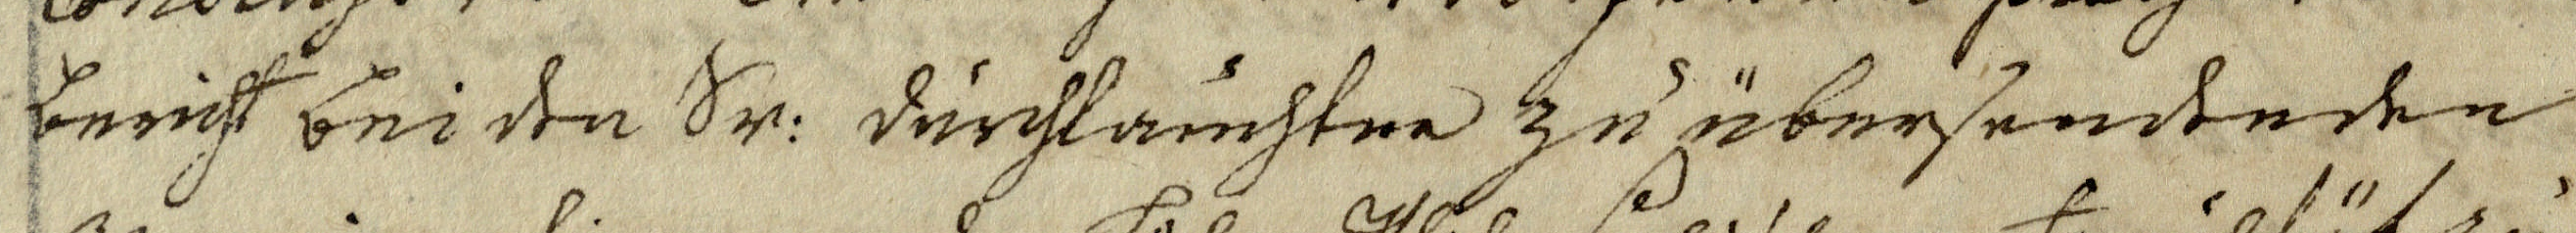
Bericht bei den Sr Durchlauchten zu übersendenden
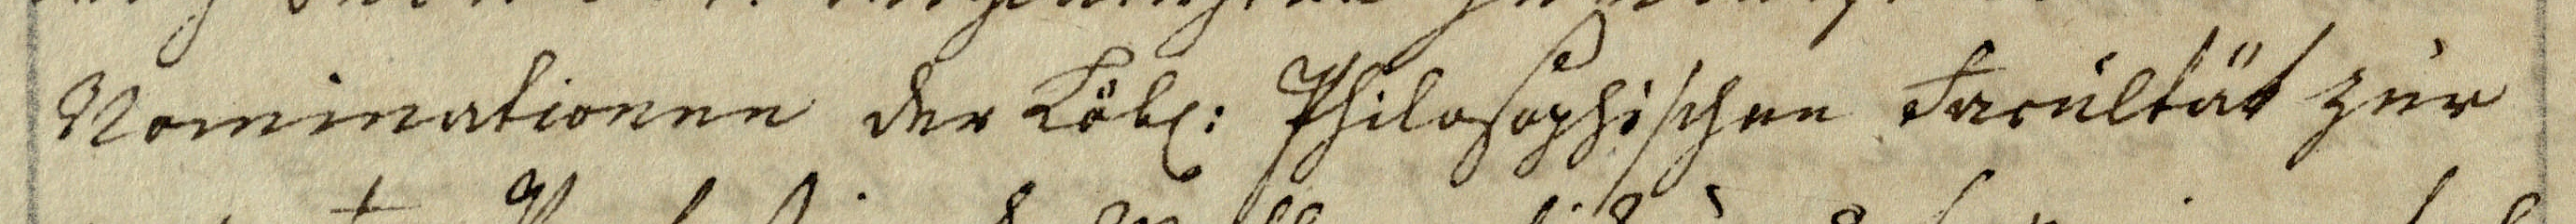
Nominationen der Löbl. Philosophischen Facultät zur
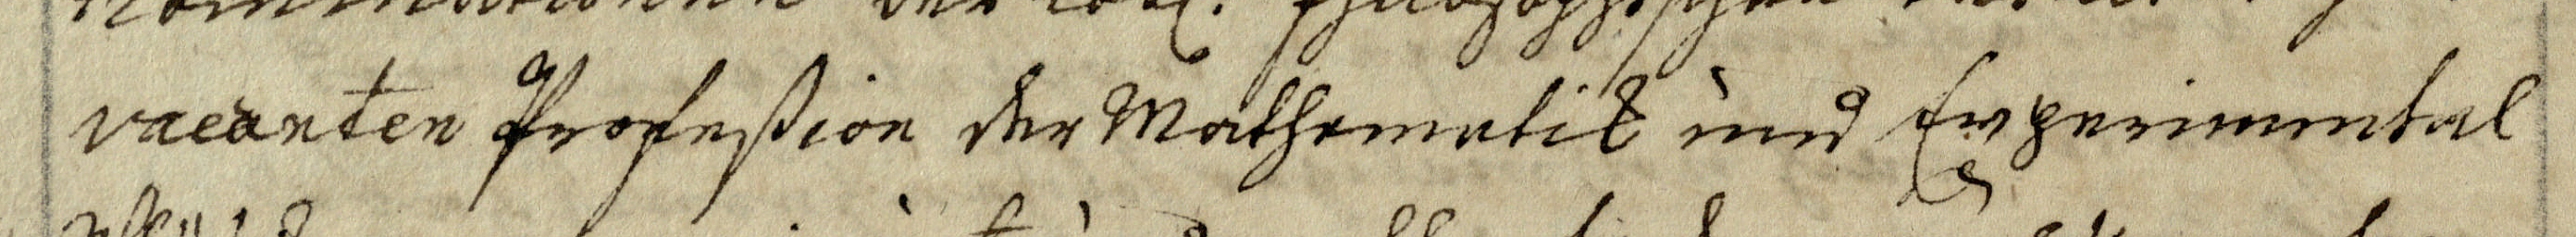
vacanten Profeßion der Mathematik und Experimental
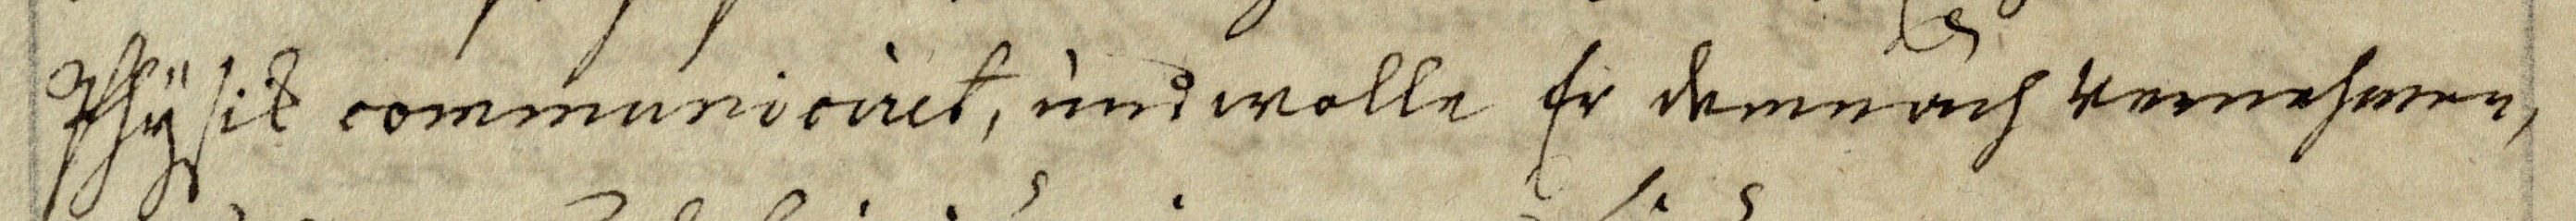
Phÿsik communiciret, und wolle Er demnach vernehmen,
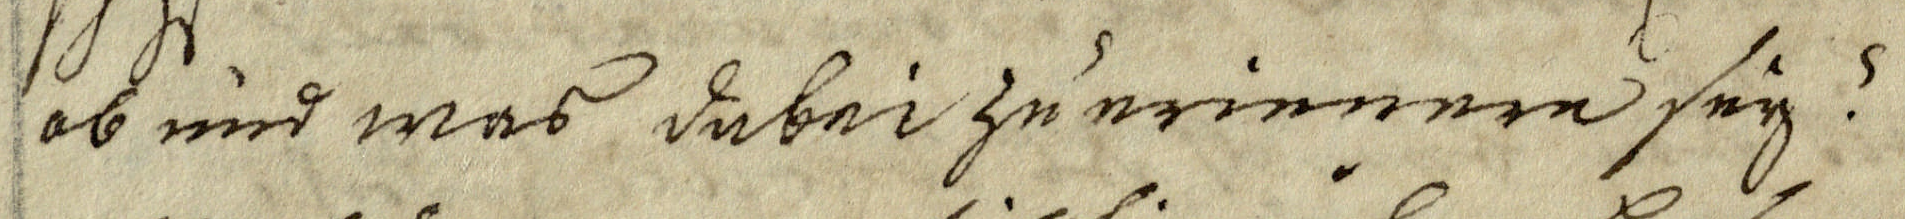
ob und was dabei zu erinnern seÿ?
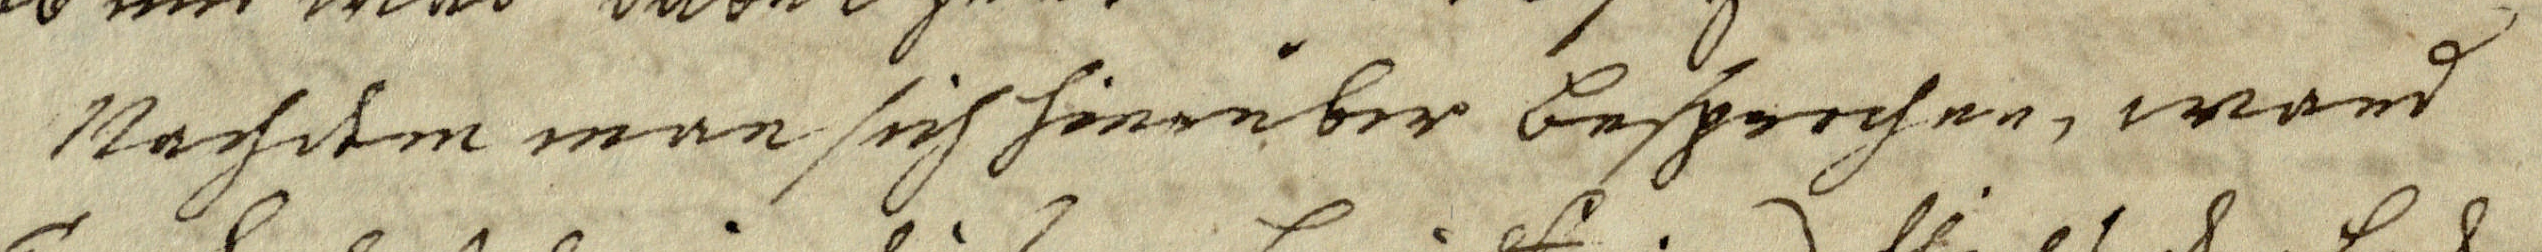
Nachdem man sich hierüber besprochen, ward
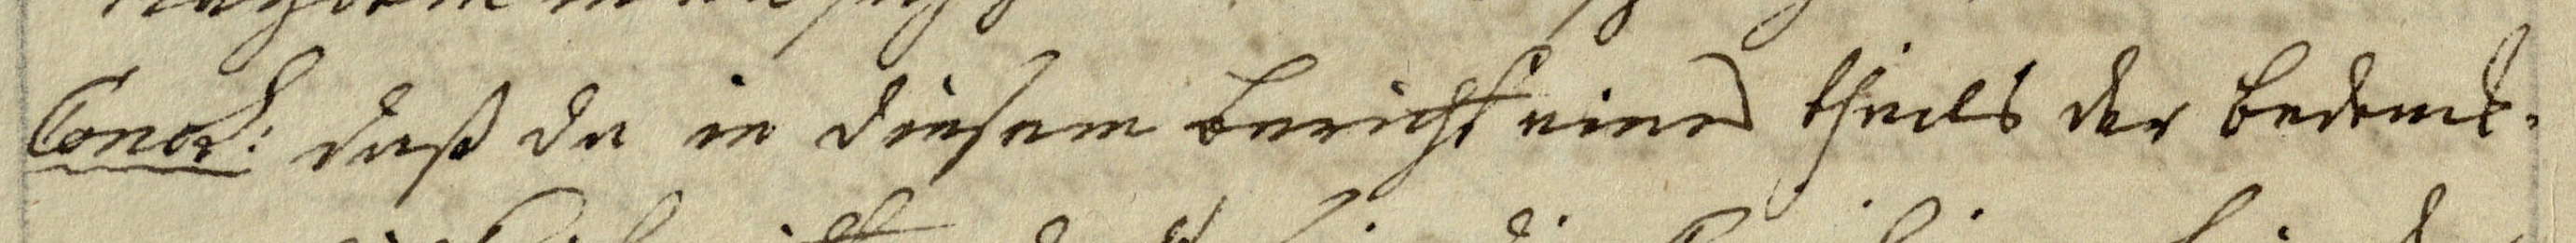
Concl. daß da in diesem Bericht eines theils der Bedenk¬
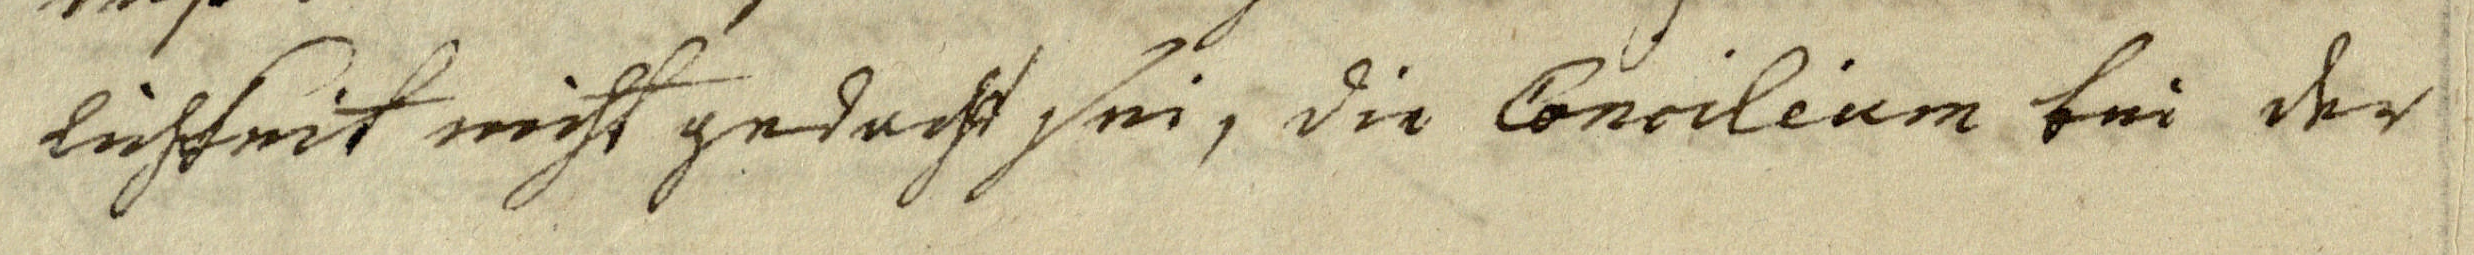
lichkeit nicht gedacht sei, die Concilium bei der
